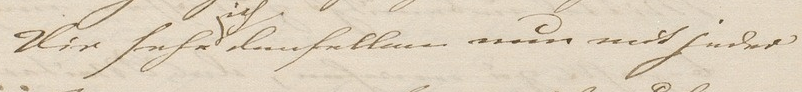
Dir sehe ich denselben nun mit jeder
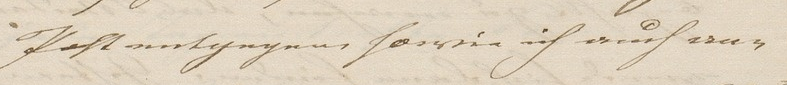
Post entgegen sowie ich auch an-
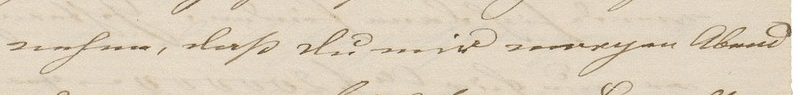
nehme, daß Du mir morgen Abend
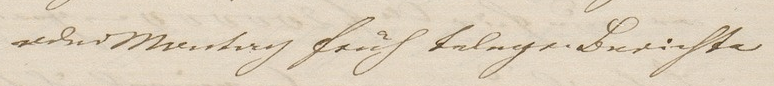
oder Montag früh telegr. Berichte
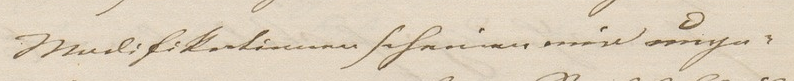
Modifikationenen scheinen mir unge-
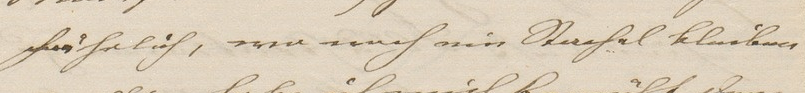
fährlich, wo noch ein Stachel bleiben
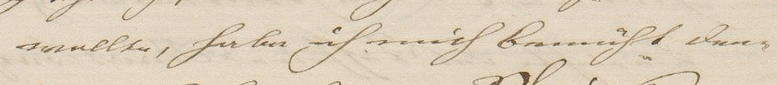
wollte, habe ich mich bemüht den-
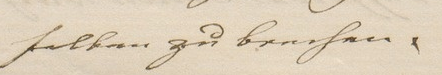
selben zu brechen.
